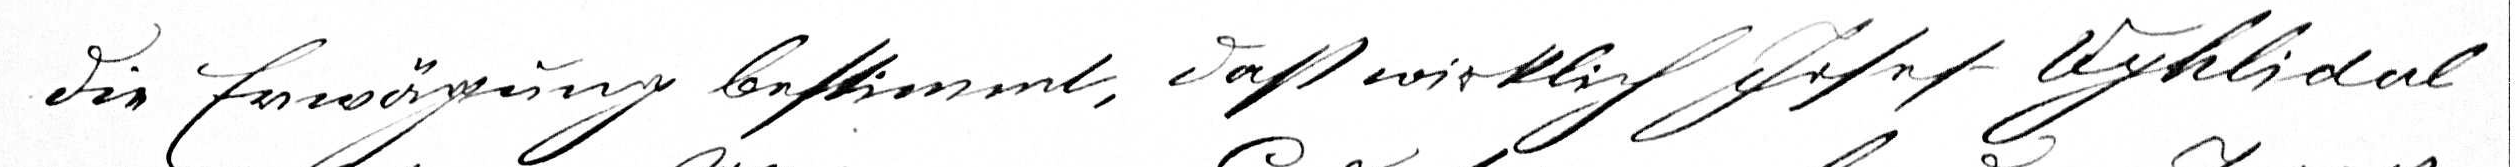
die Erwägung bestimmt, daß wirklich Josef Vyhlidal
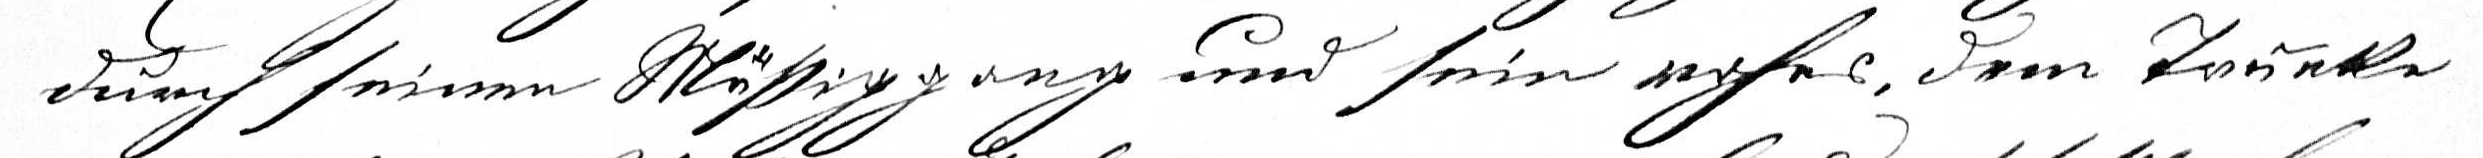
durch seinen Müßiggang und sein rohes, dem Trunke
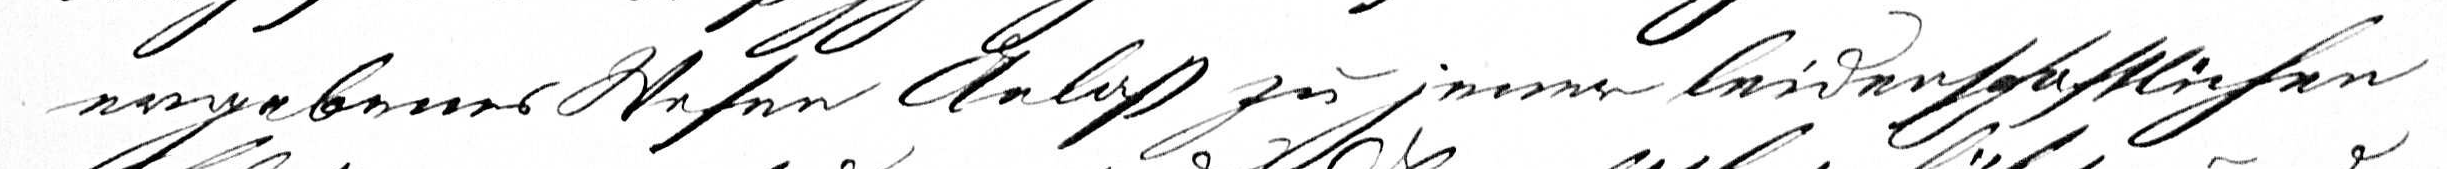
ergebenes Wesen Anlaß zu jener leidenschaftlichen
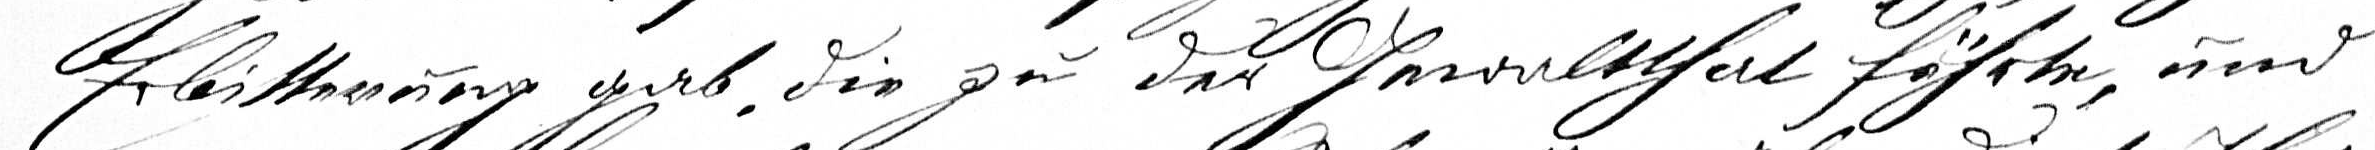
Erbitterung gab, die zu der Gewaltthat führte, und
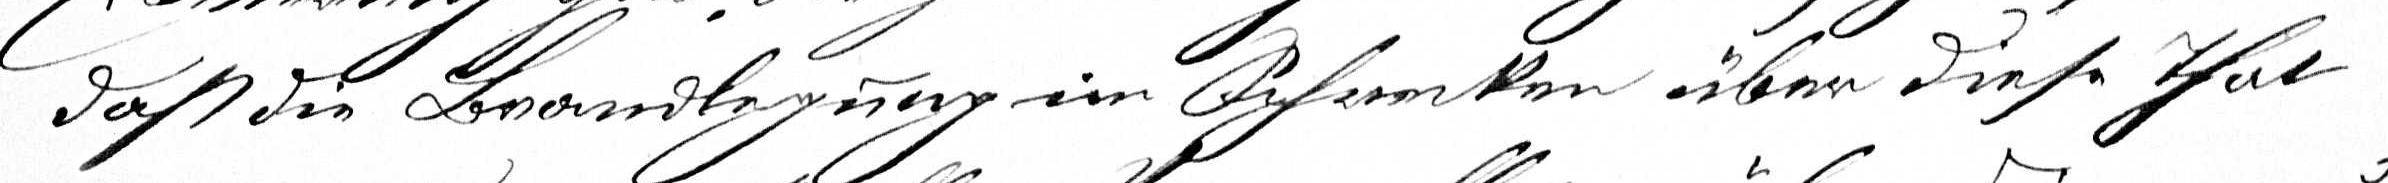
daß die Brandlegung im Schrecken über diese That
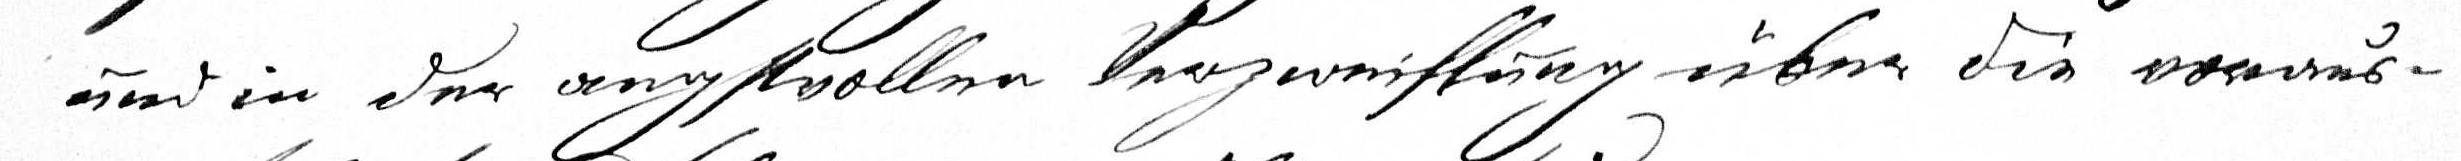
und in der angstvollen Verzweiflung über die voraus¬
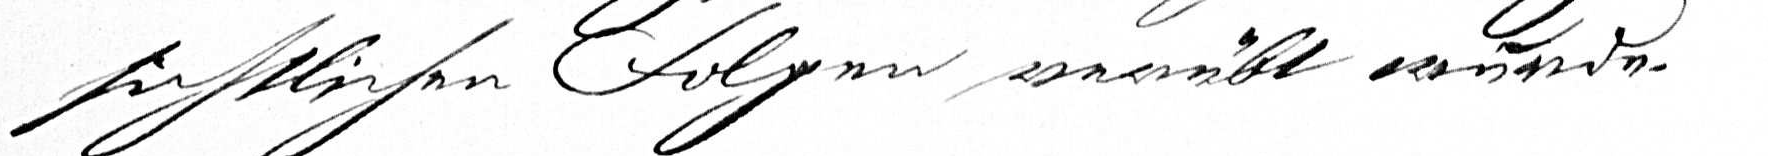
sichtlichen Folgen verübt wurde.
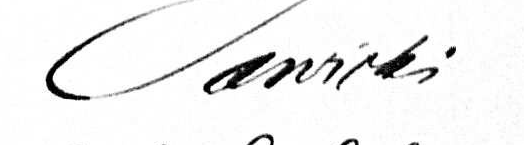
Sawicki
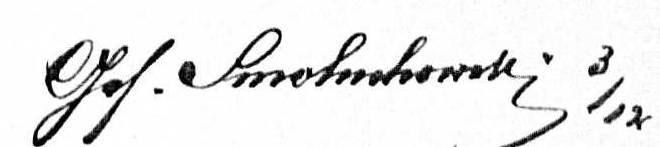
Ges. Smolnchowcki 3/12
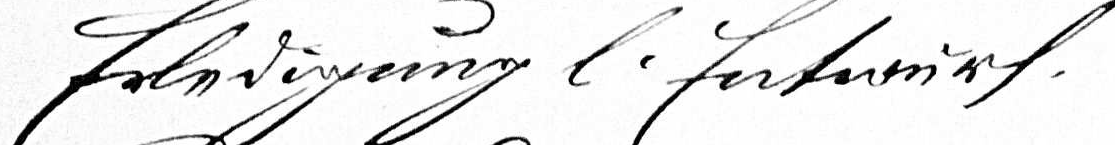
Erledigug l. Entwurf.
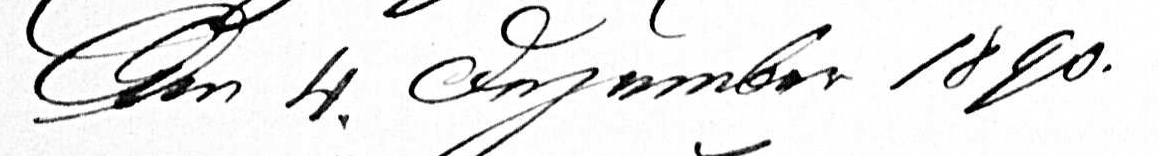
Am 4. Dezember 1890.
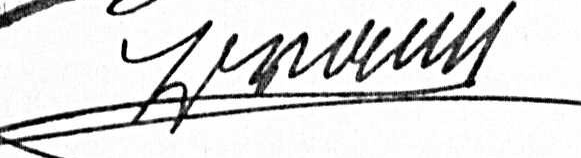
Braun
